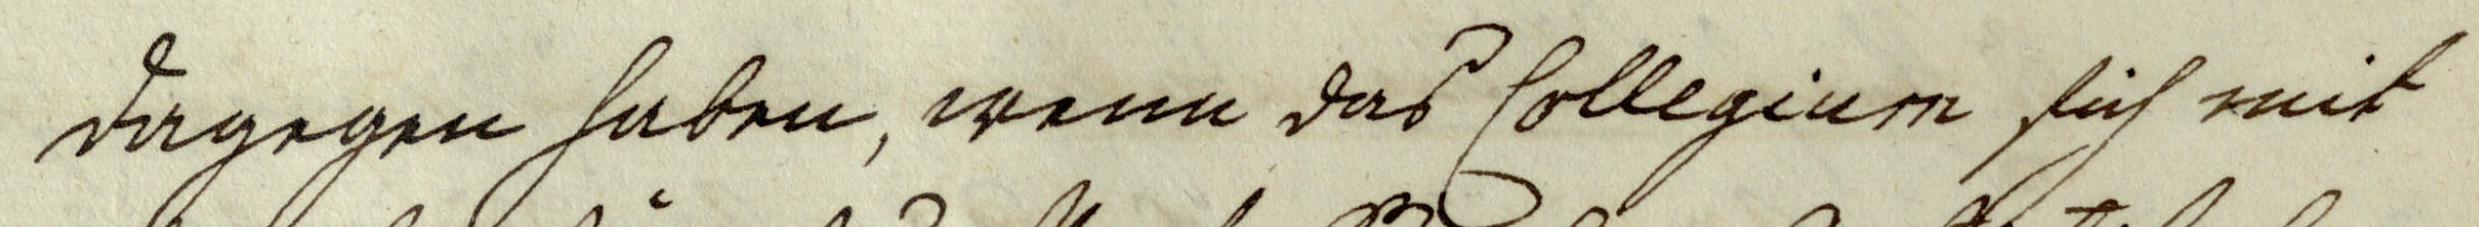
dagegen haben, wenn das Collegium sich mit
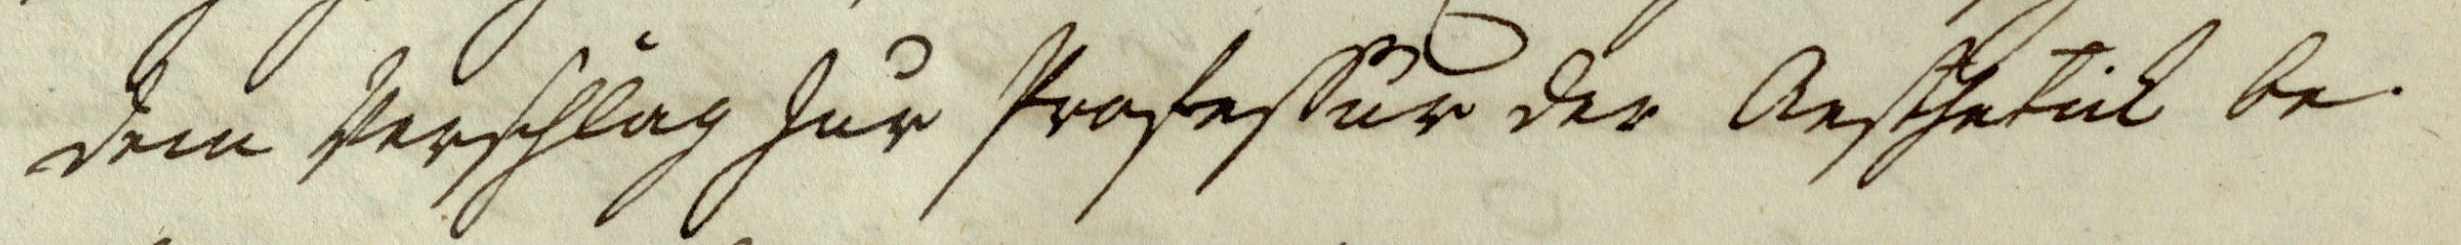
dem Vorschlag zur Professur der Aesthetik be¬
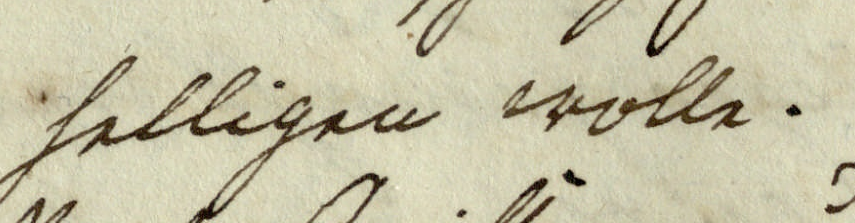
helligen wolle.
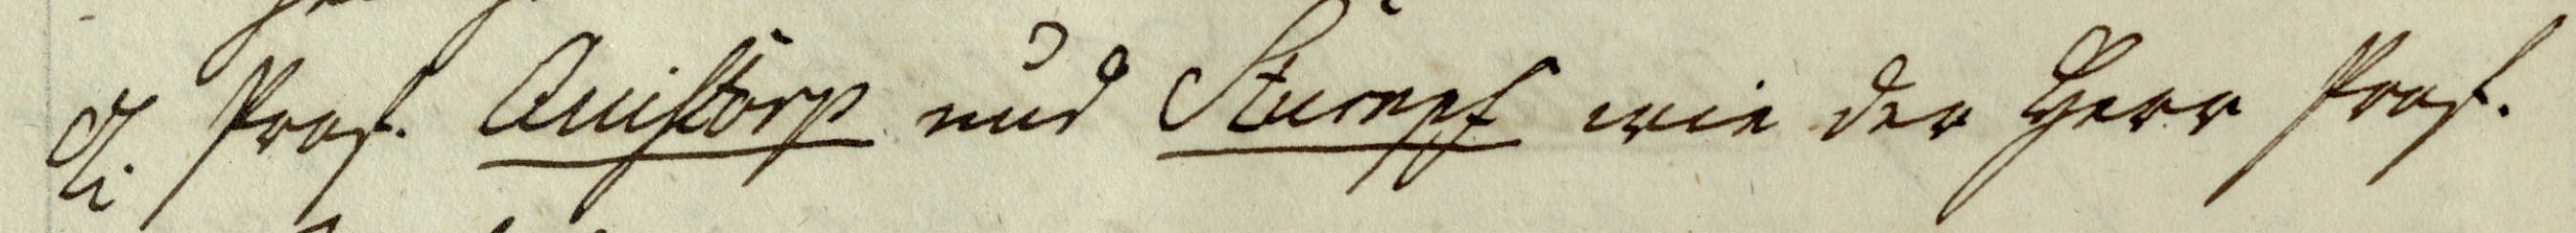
dh. Prof. Quistorp und Stumpf wie der Herr Prof.
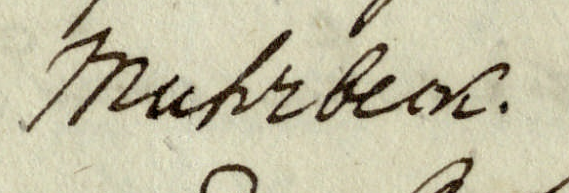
Muhrbeck.
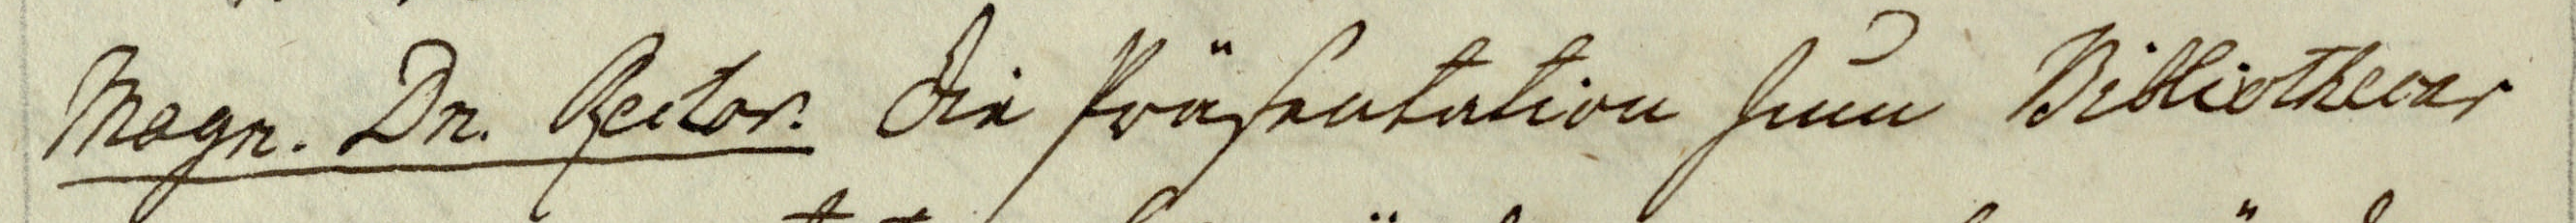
Magn. Dn. Rector. Die Präsentation zum Bibliothecar
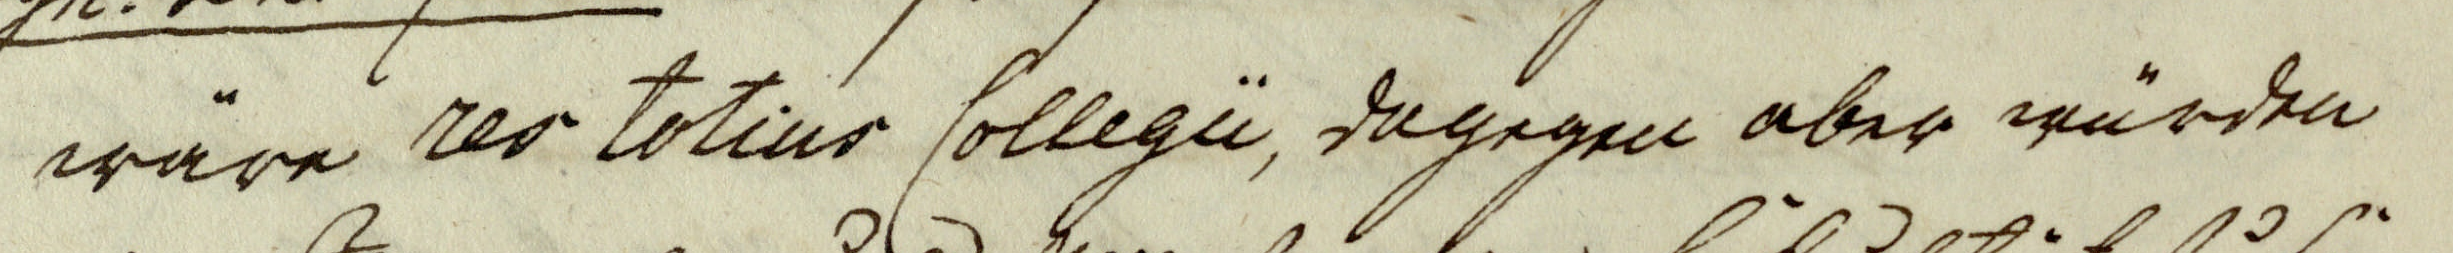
wäre res totius Collegii, dagegen aber würden
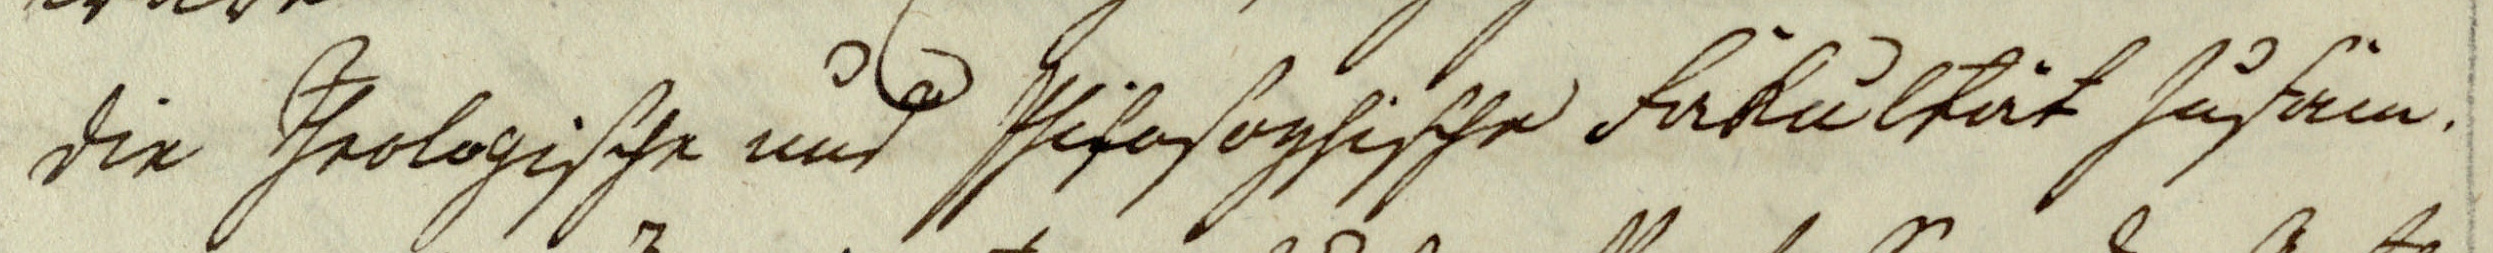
die Theologische und Philosophische Fakultät zusam¬
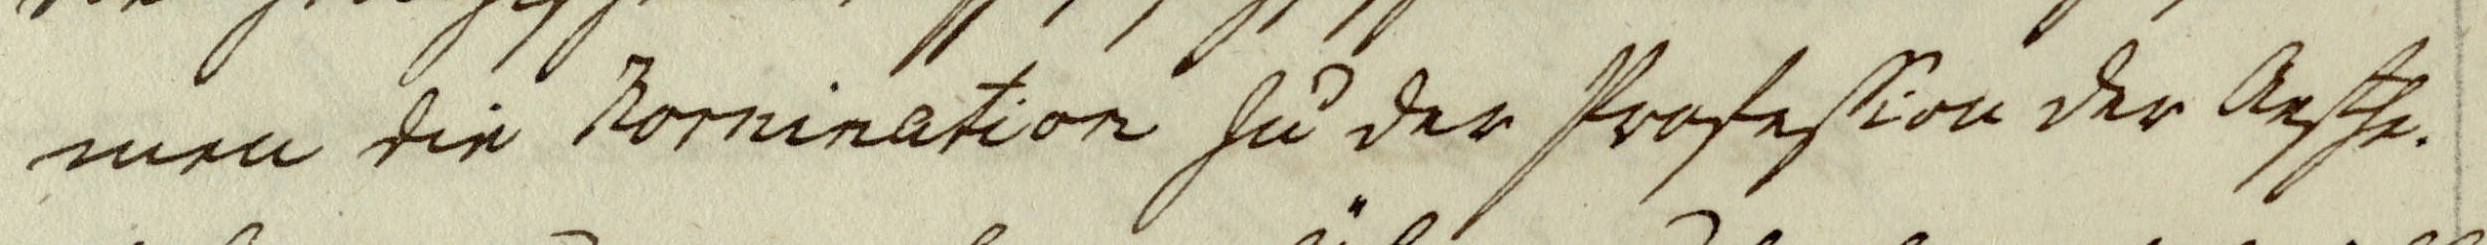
men die Nomination zu der Profession der Aesthe¬
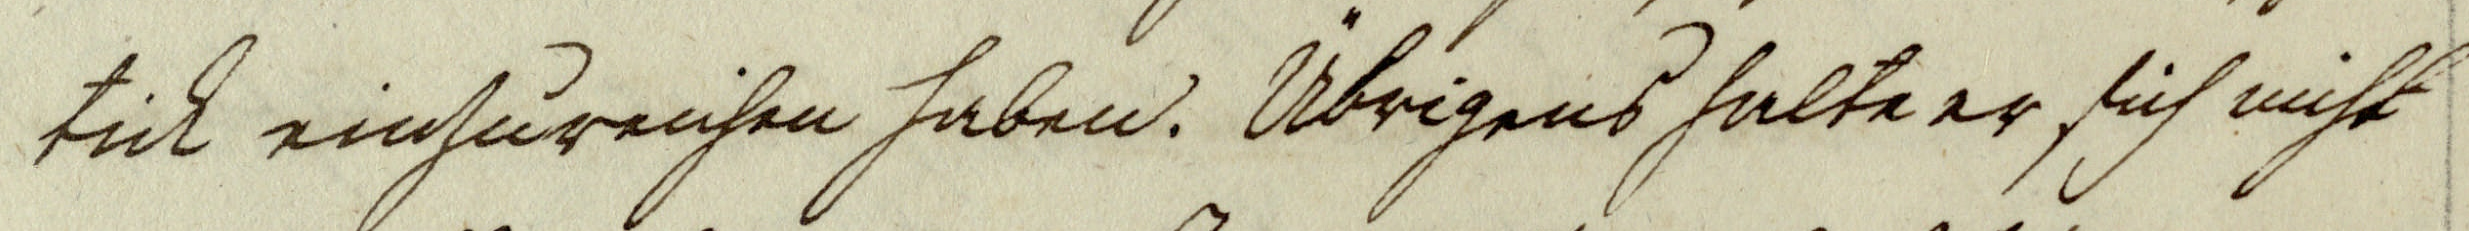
tik einzureichen haben. Übrigens halte er sich nicht
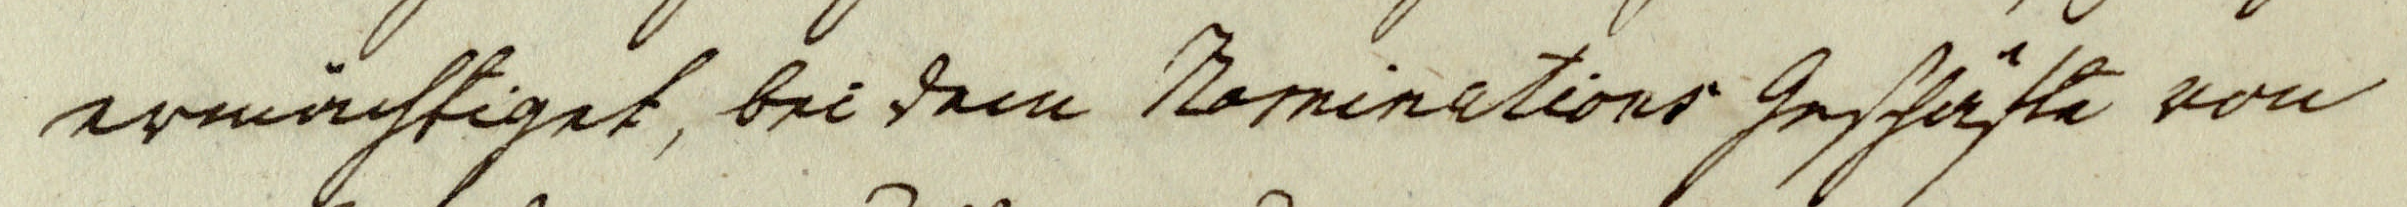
ermächtiget, bei dem Nominations Geschäfte von
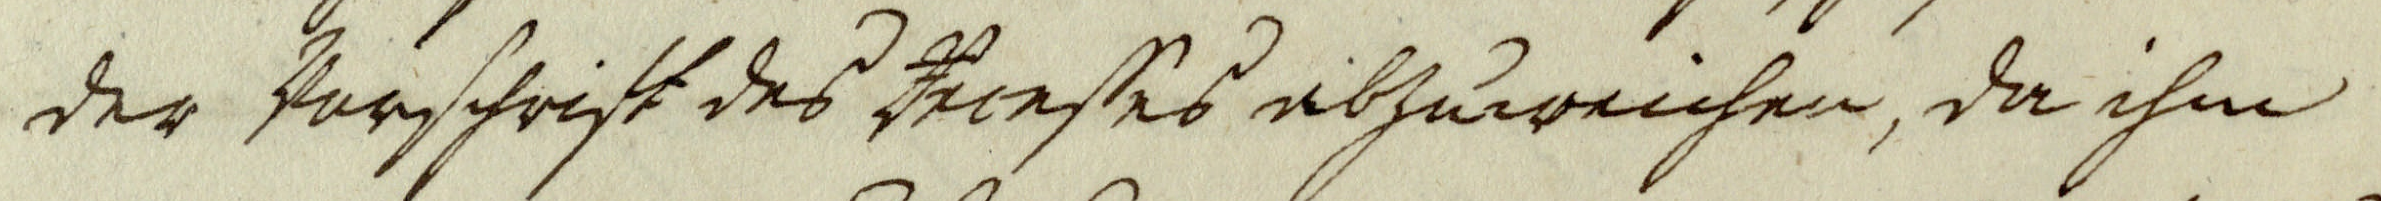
der Vorschrift des Recesses abzuweichen, da ihm
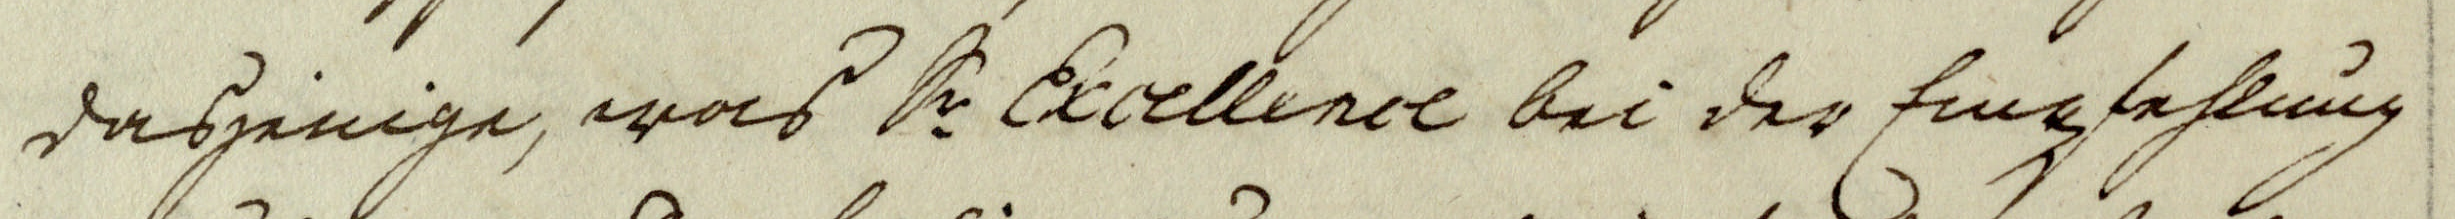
dasjenige, was Sr. Excellence bei der Empfehlung
